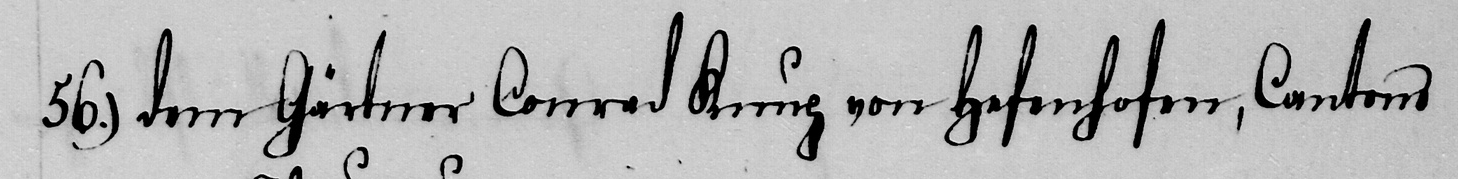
56.) dem Gärtner Conrad Kunz von Hefenhofen, Cantons
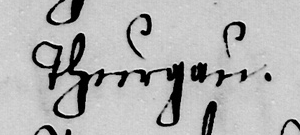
Thurgau.
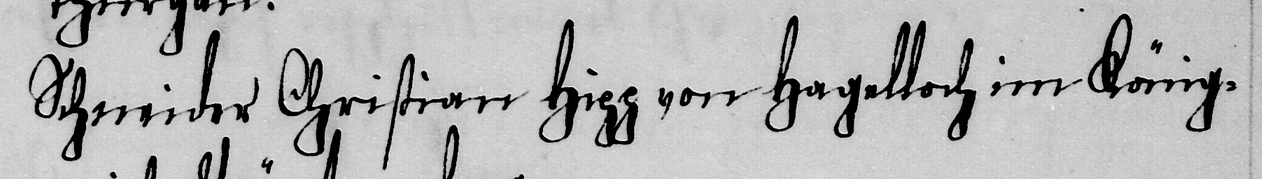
Schneider Christian Hipp von Hagelloch im König¬
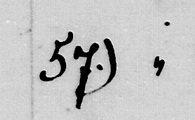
57.)
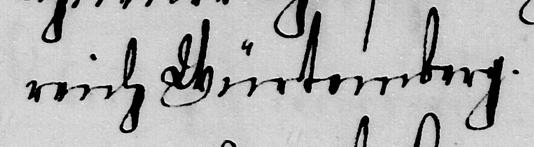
reich Würtemberg.
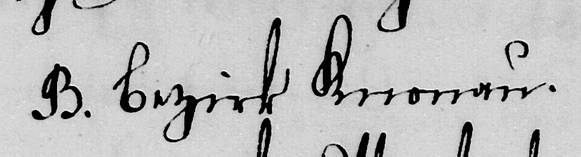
B. Bezirk Knonau.
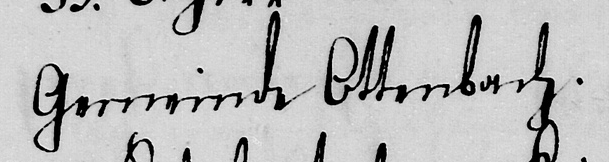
Gemeinde Ottenbach.
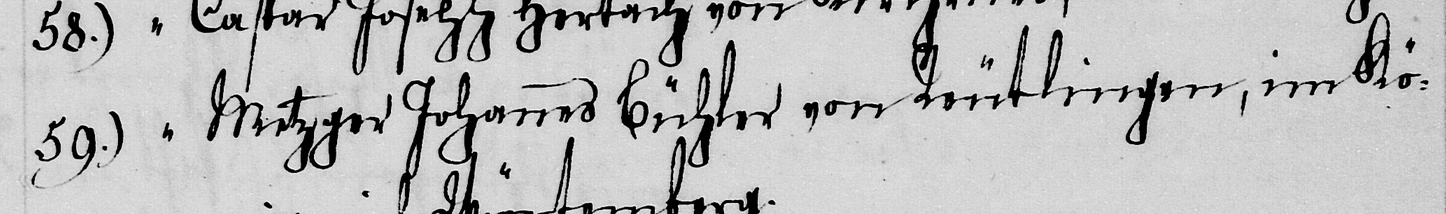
59.) “ Metzger Johannes Büchler von Reutlingen, im Kö¬
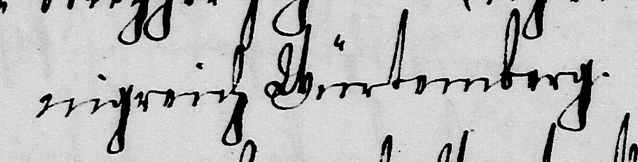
nigreich Würtemberg.
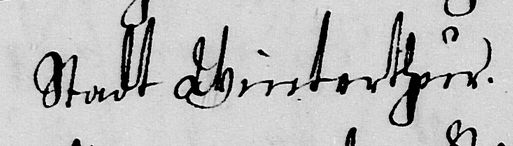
Stadt Winterthur.
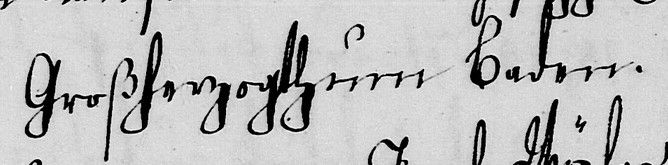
Großherzogthum Baden.
